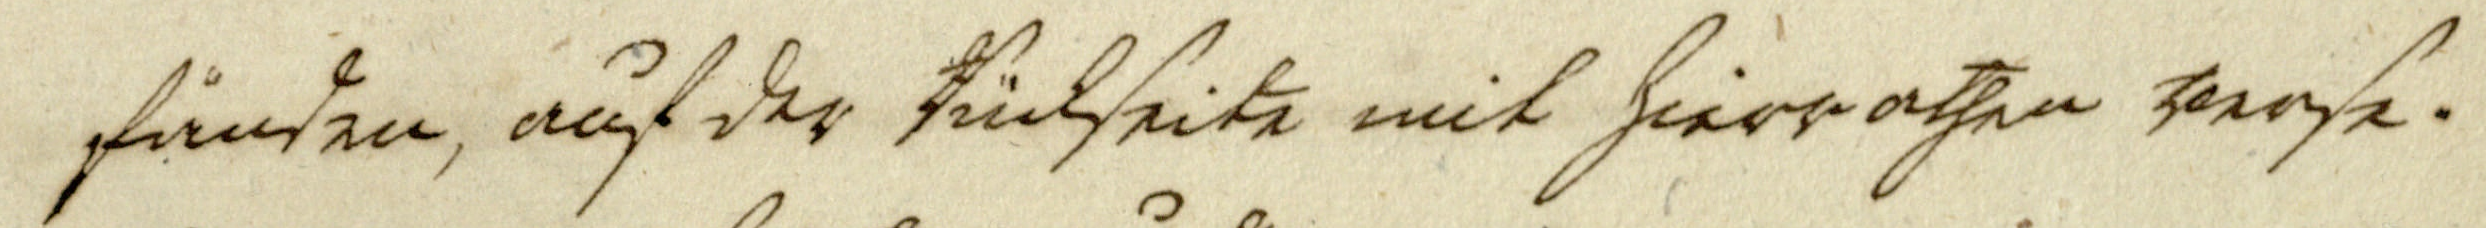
fänden, auf der Rückseite mit Zierrathen verse¬
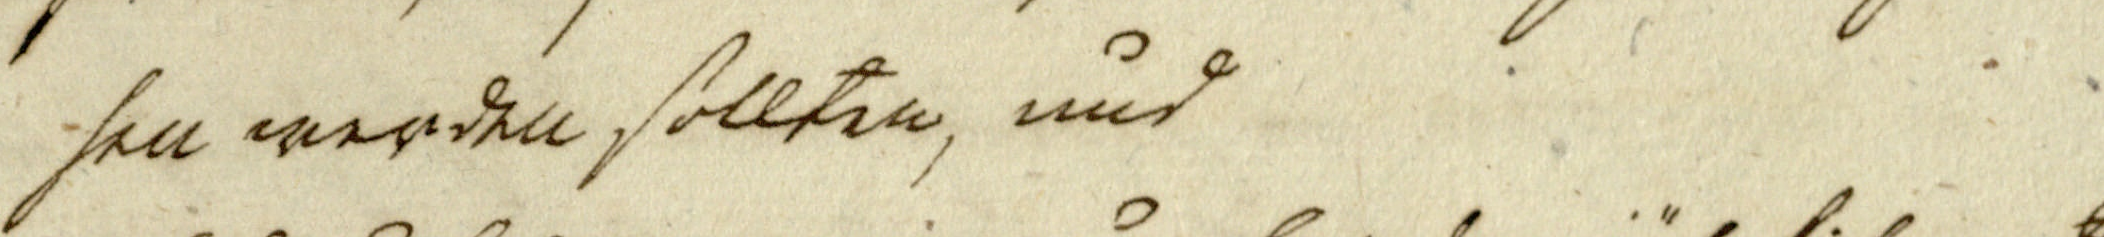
hen werden sollten, und
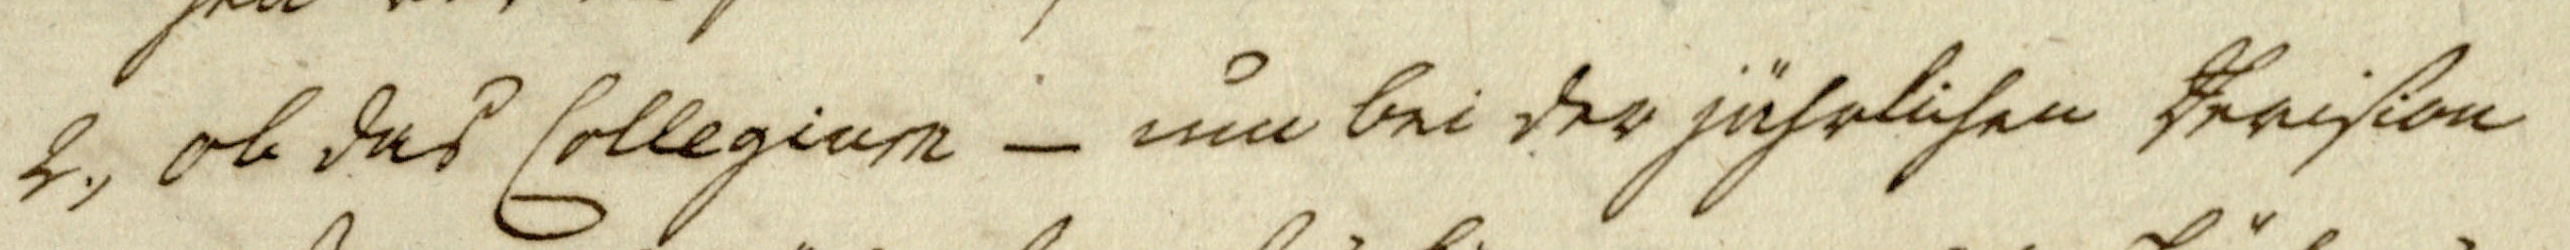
2., ob das Collegium um bei der jährlichen Revision
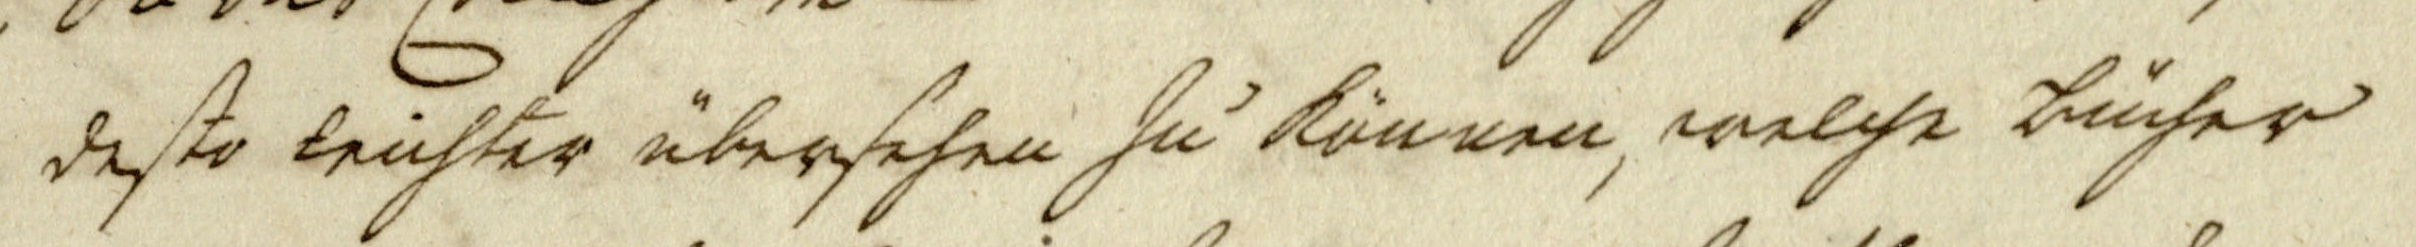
desto leichter übersehen zu können, welche Bücher
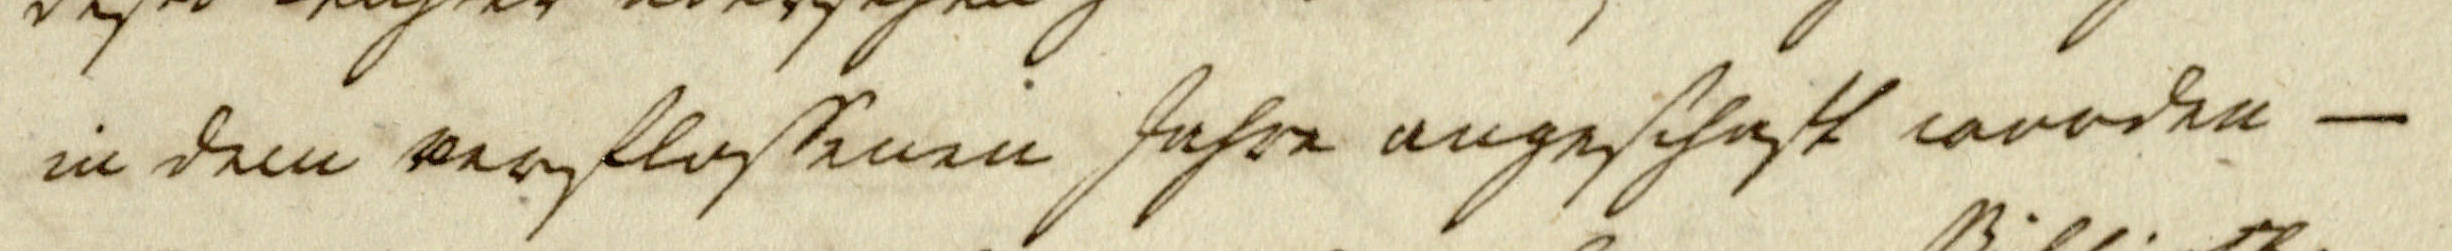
in dem verflossenen Jahre angeschaft worden
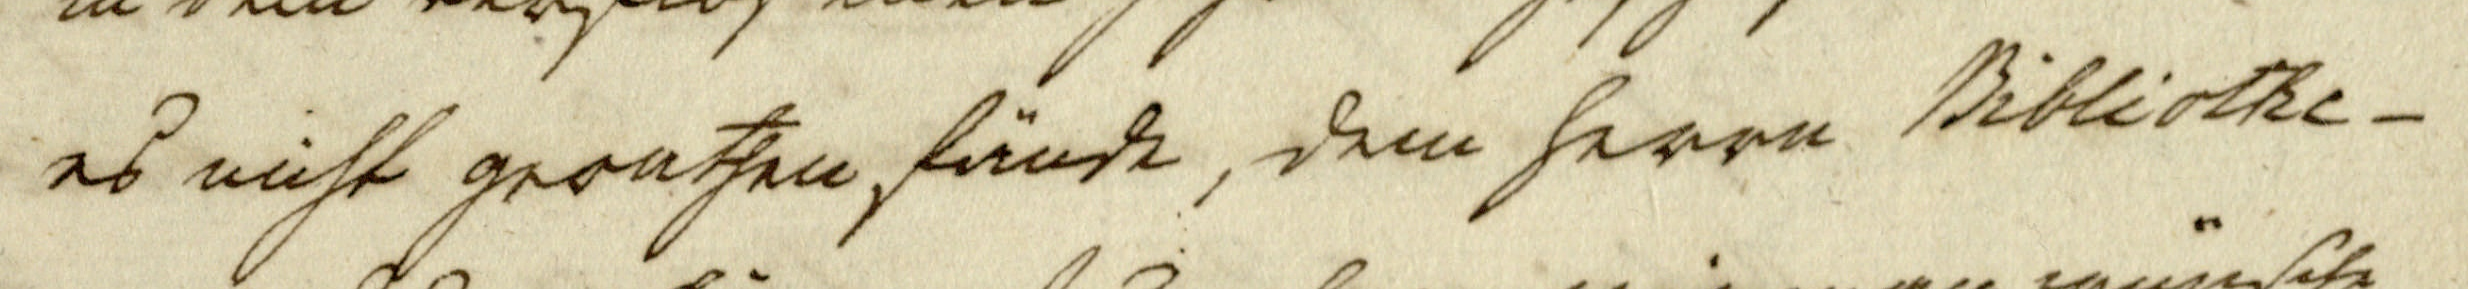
es nicht gerathen fände, dem herrn Bibliothe¬
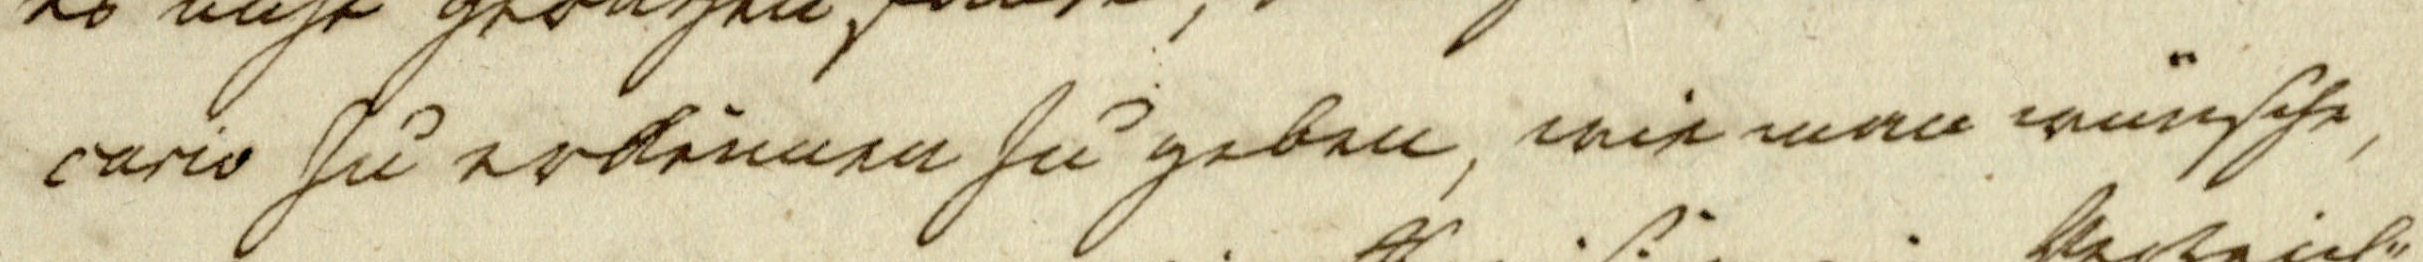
cario zu erkennen zu geben, wie man wünsche,
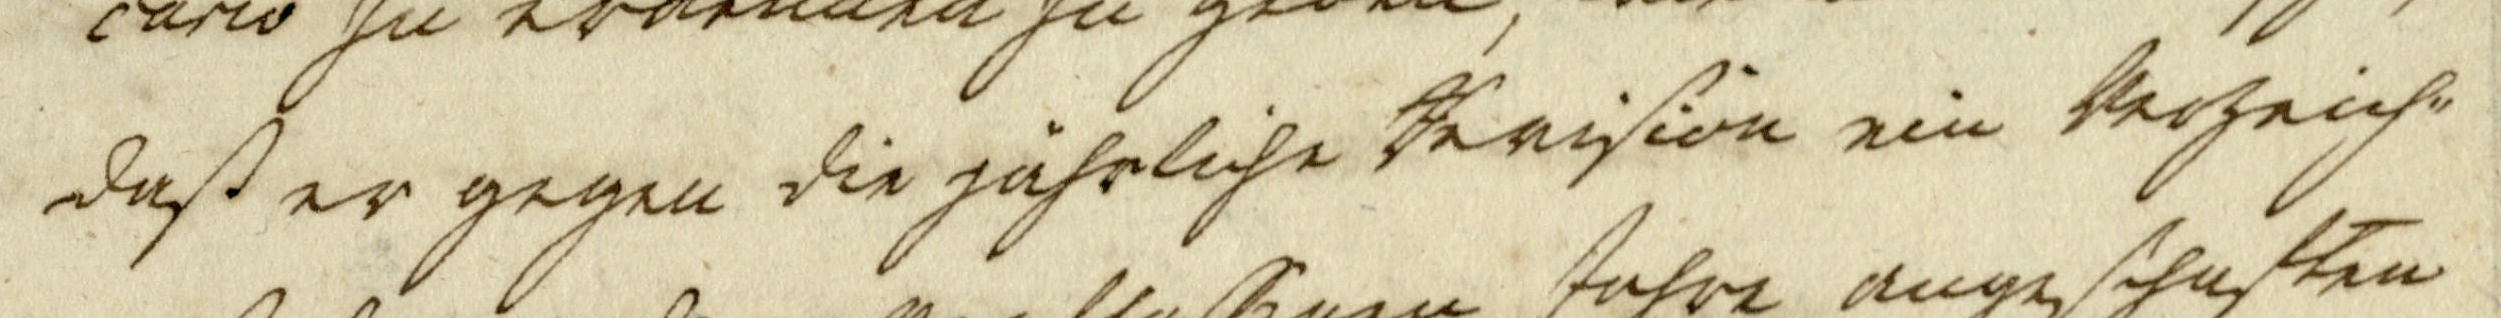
daß er gegen die jährliche Revision ein Verzeich¬
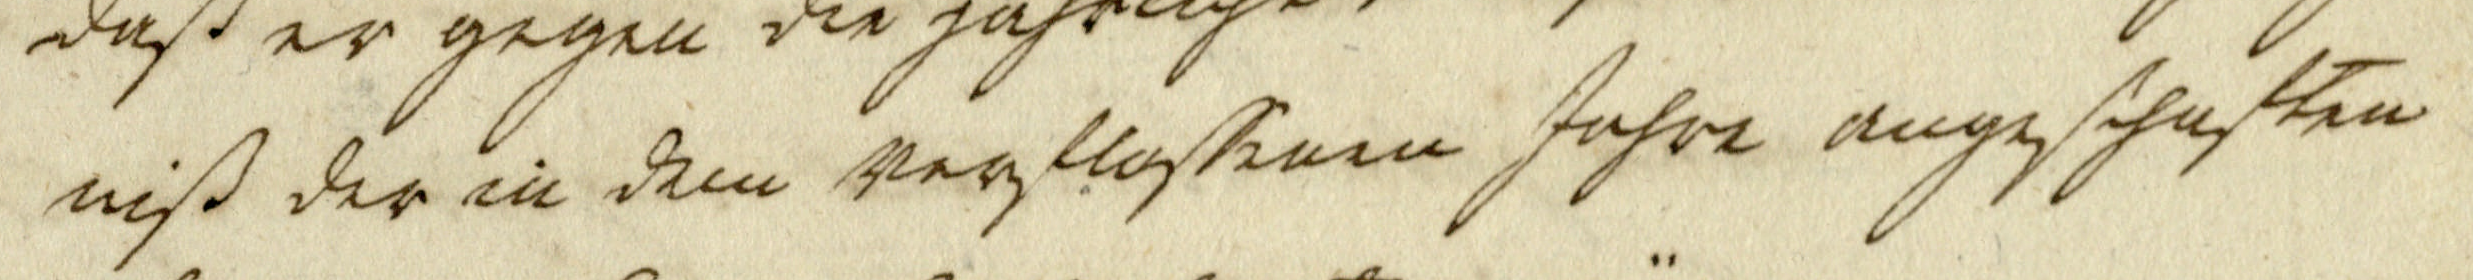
niß der in dem verflossenen jahre angeschaften
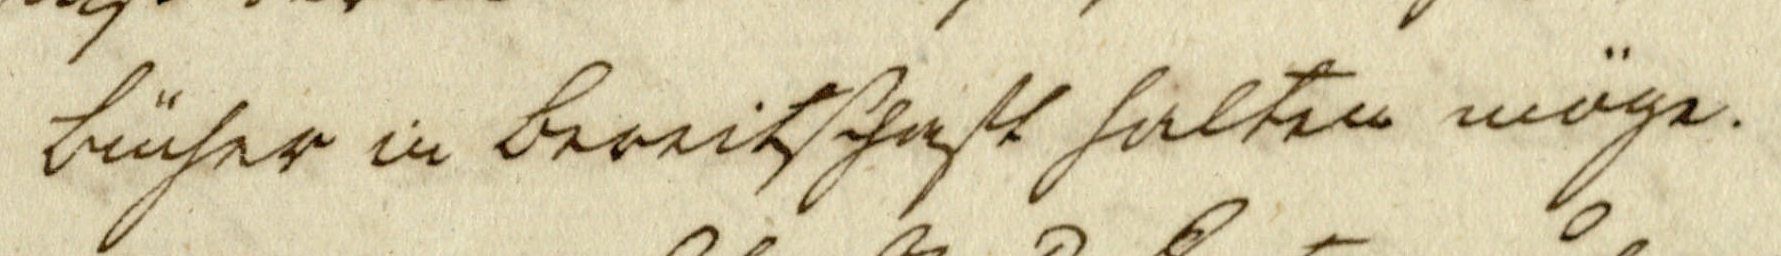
Bücher in Bereitschaft halten möge.
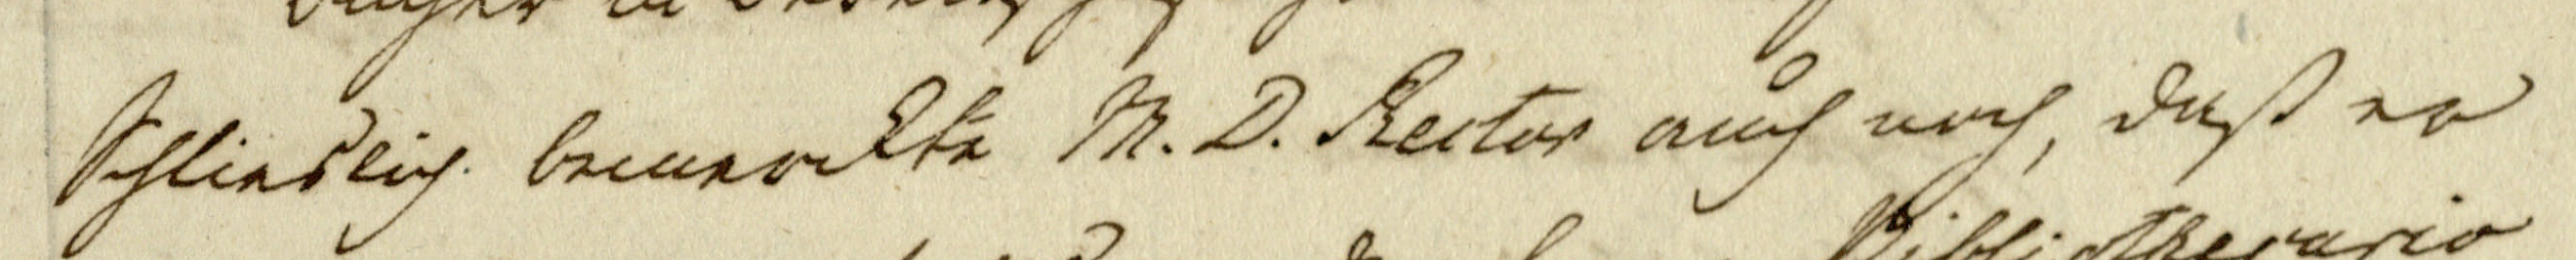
Schließlich bemerckte M. D. Rector auch noch, daß er
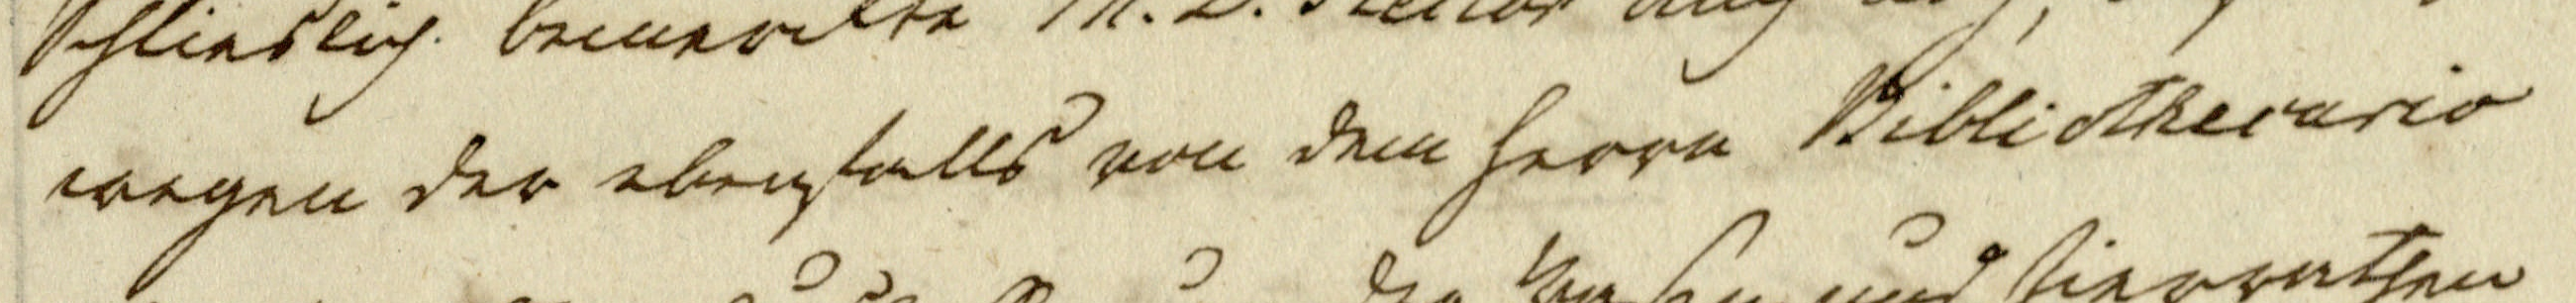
wegen der ebenfalls von dem herrn Bibliothecario
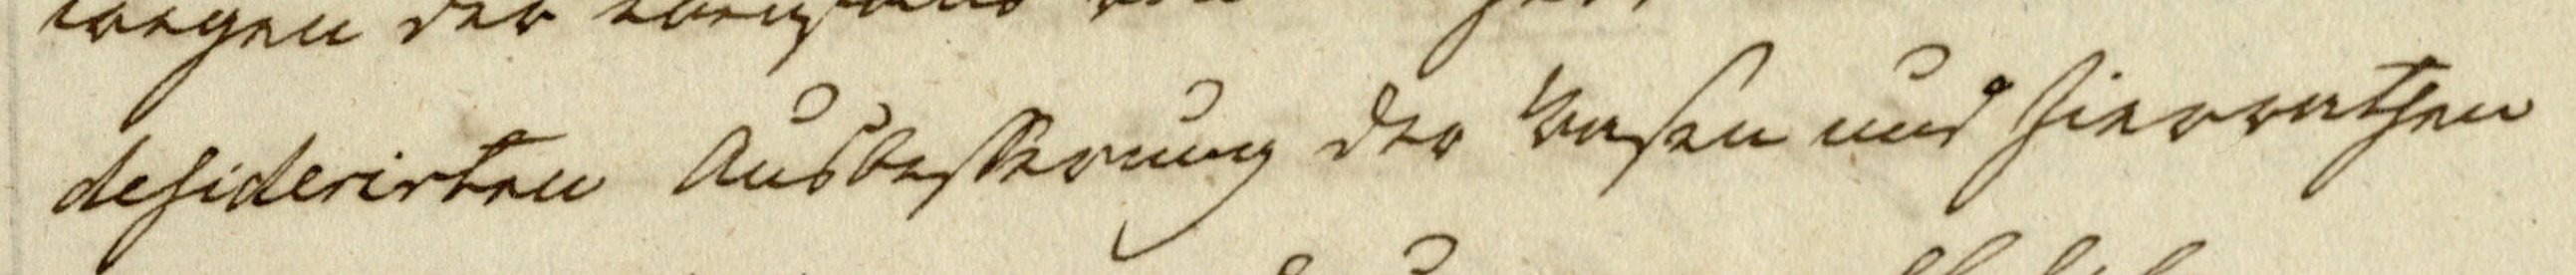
desiderirten Ausbesserung der Vasen und Zierrathen
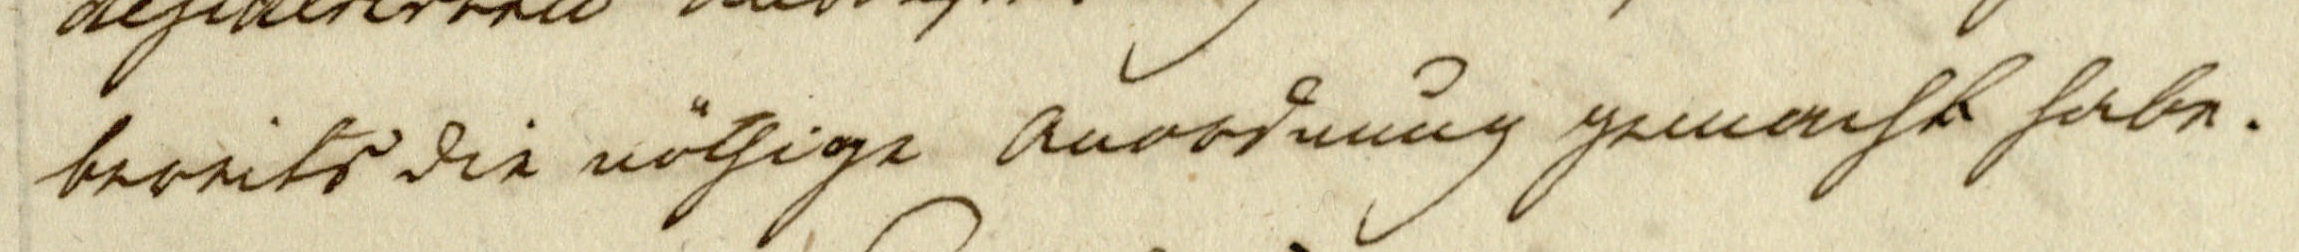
bereits die nöthige Anordnung gemacht habe.
